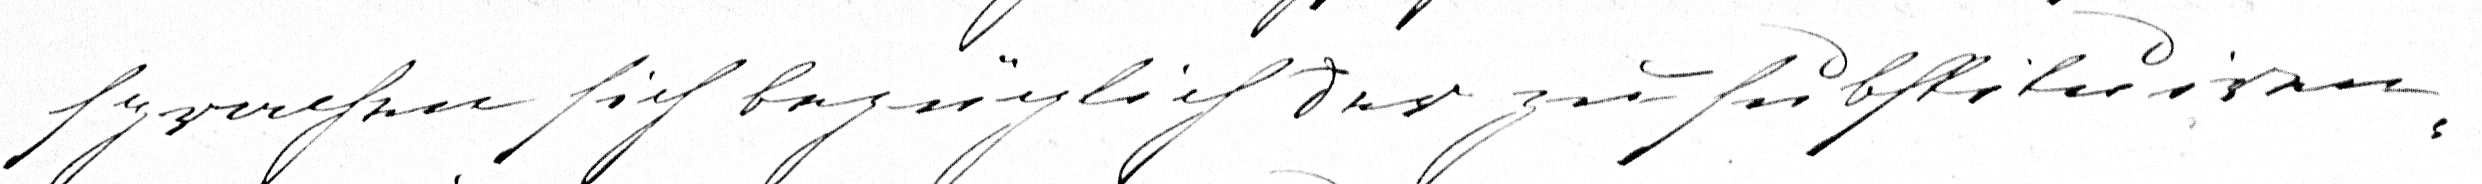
sprachen sich bezüglich der zu substituieren
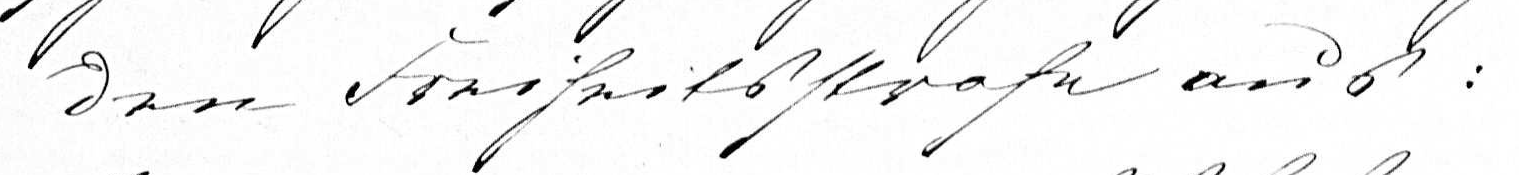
den Freiheitsstrafe aus:
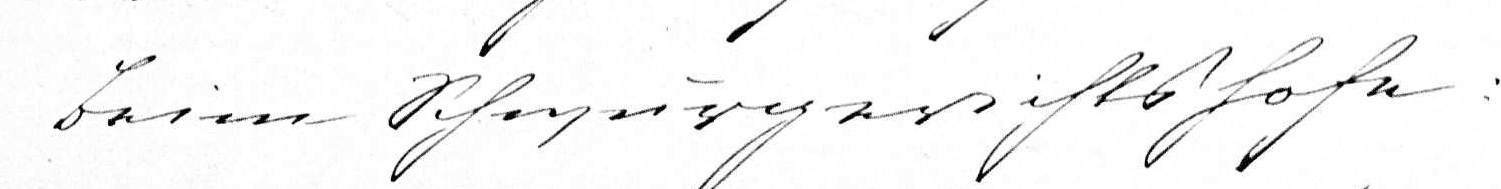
Beim Schwurgerichtshofe:
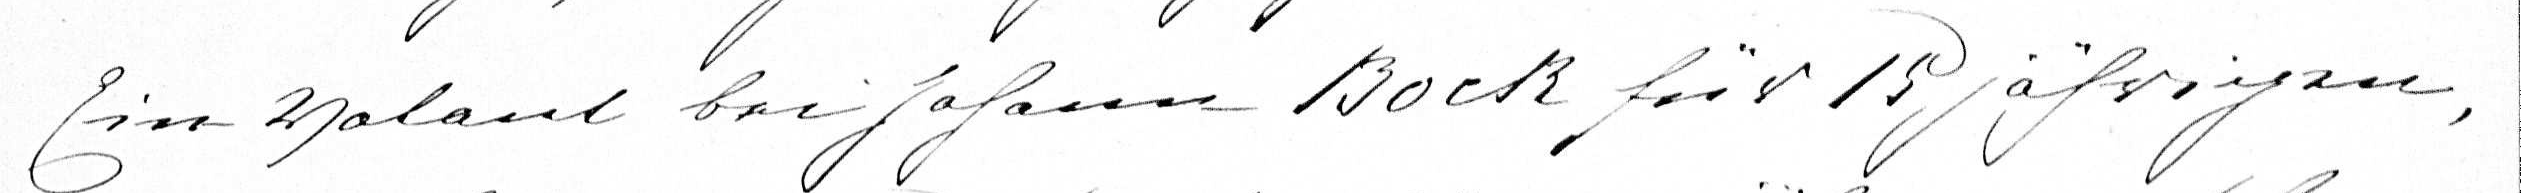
Ein Volant bei Johann Bock für 15 jährigen,
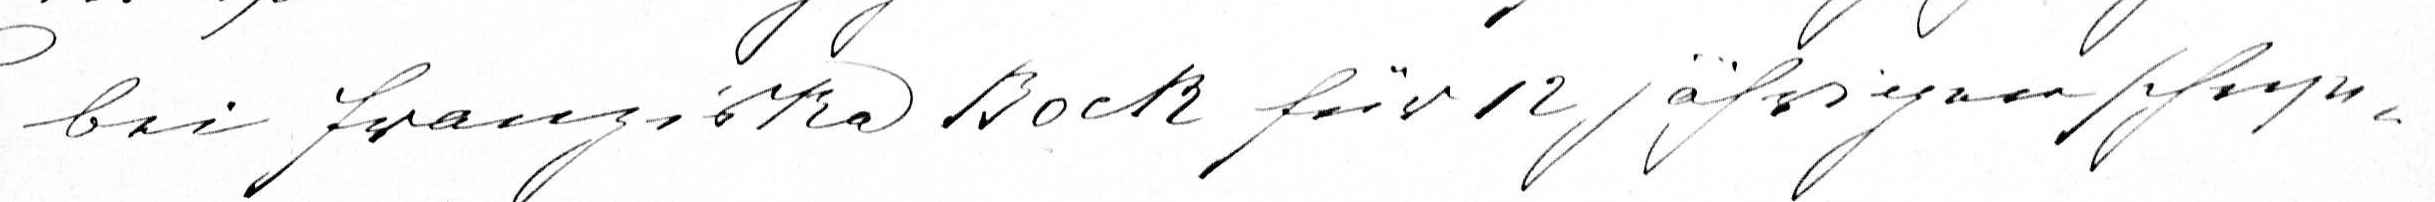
bei Franziska Bock für 12 jährigen schwer¬
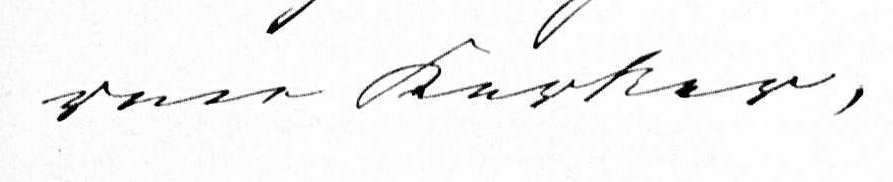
ner Kerker,
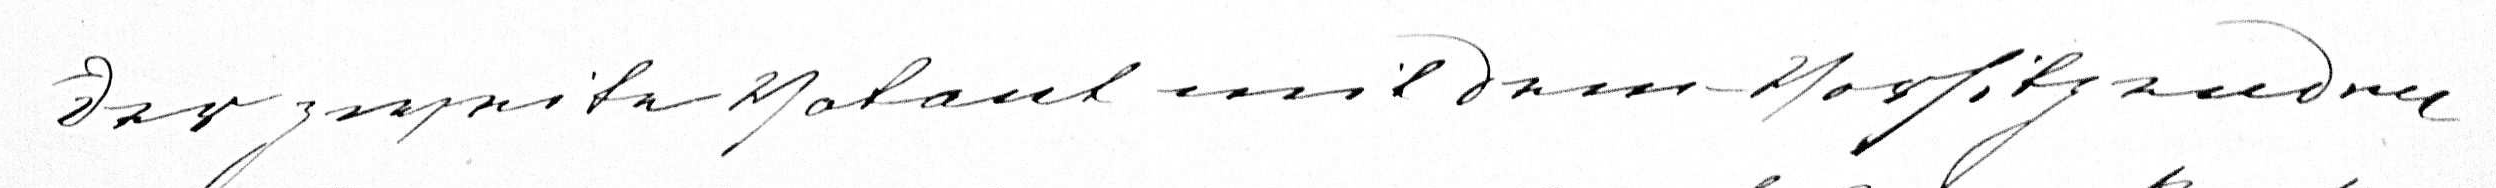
Die zwiete Volant mit dem Vorsitzenden
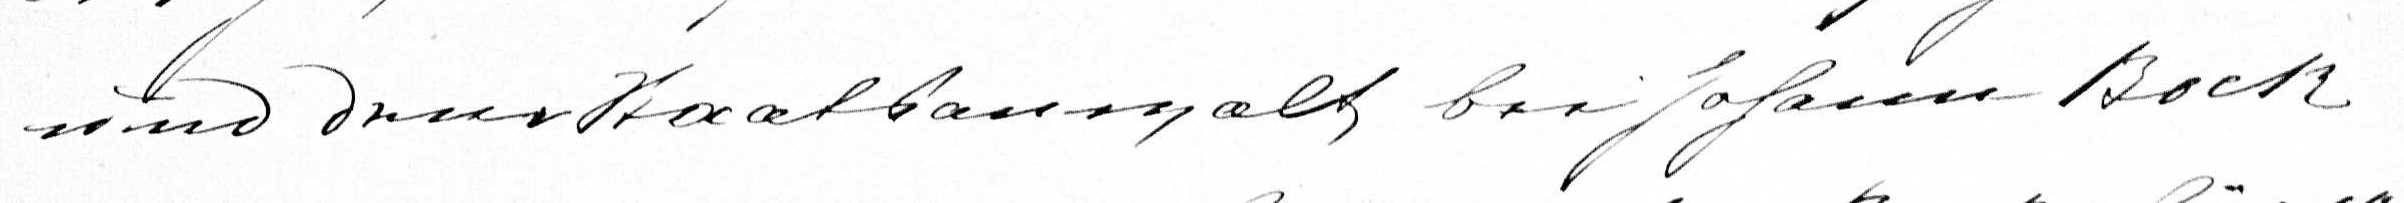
und dem Staatsanwalt bei Johann Bock
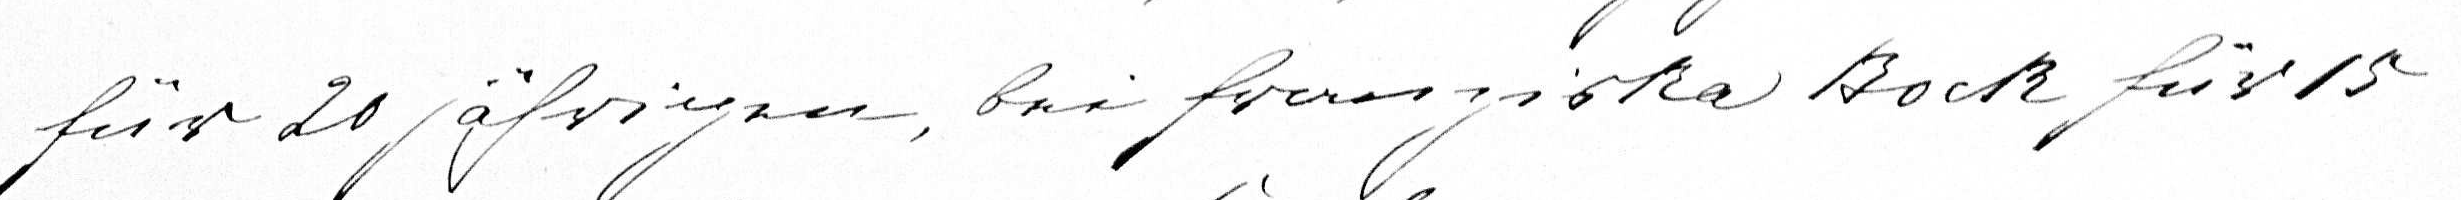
für 20 jährigen , bei Franziska Bock für 15
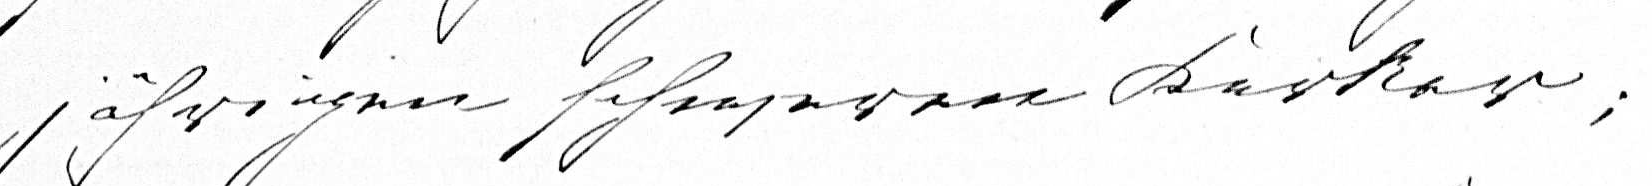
jährigen schweren Kerker;
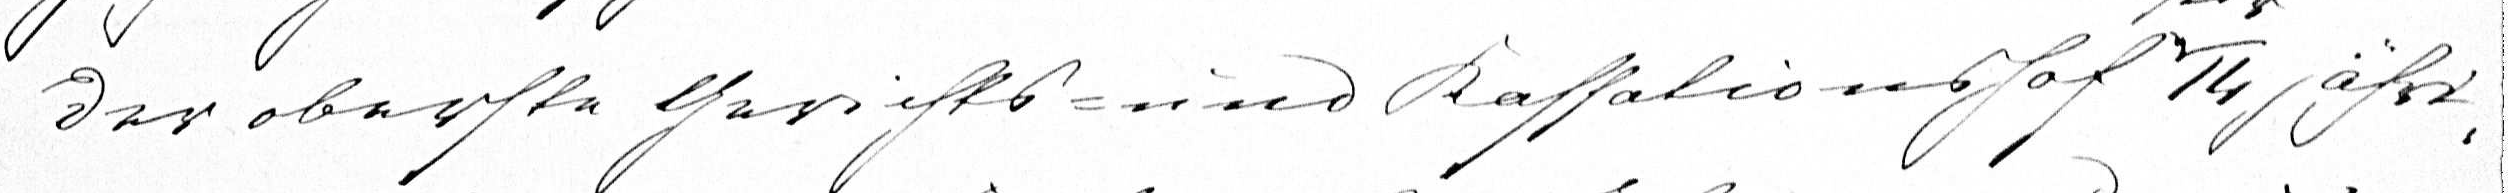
Der oberste Gerichts- und Kassationshof für 14 jähri¬
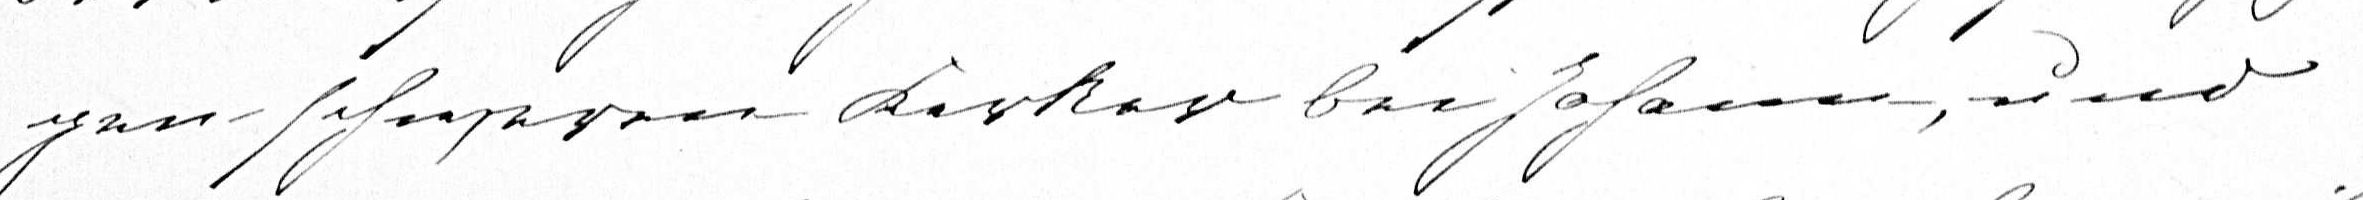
gen schweren Kerker bei Johann und
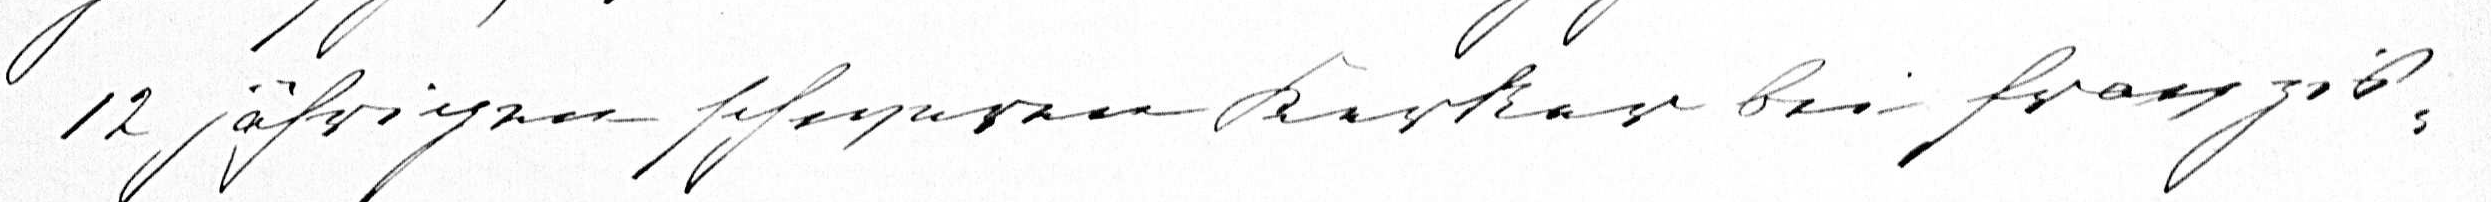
12 jährigen schweren Kerker bei Franzis¬
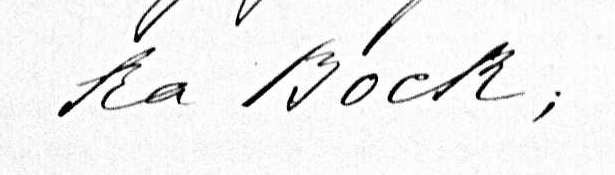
ka Bock;
